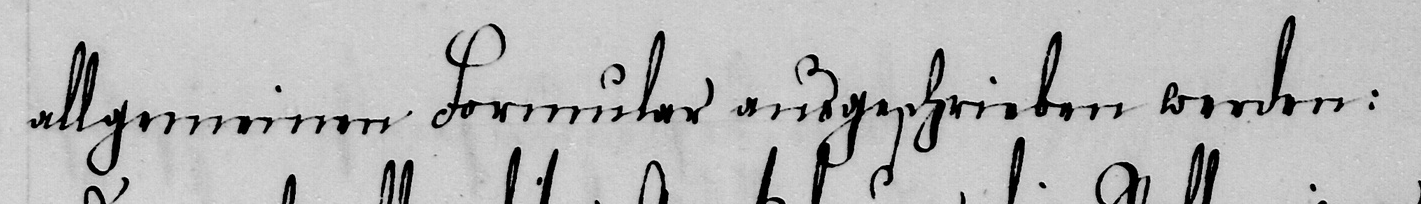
allgemeinen Formular ausgeschrieben werden:
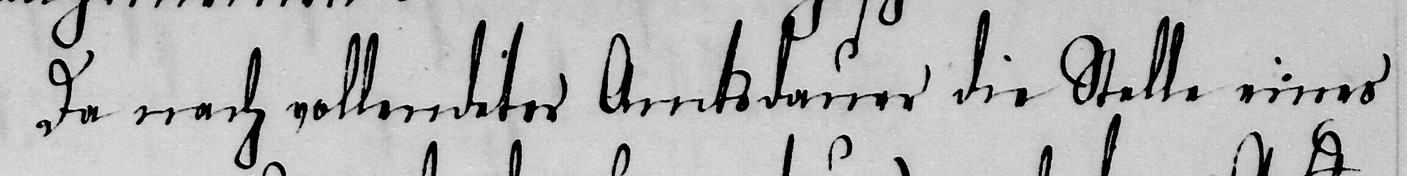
Da nach vollendeter Amtsdauer die Stelle eines
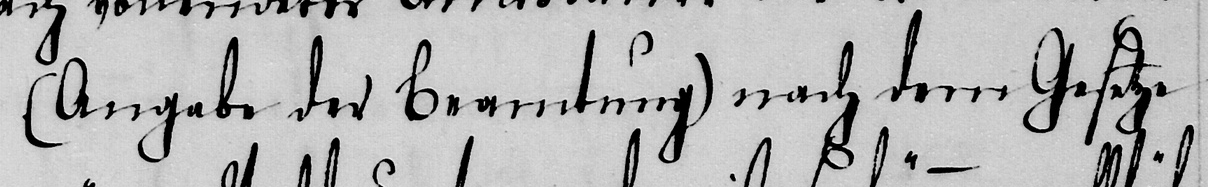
(Angabe der Beamtung) nach dem Gesetze
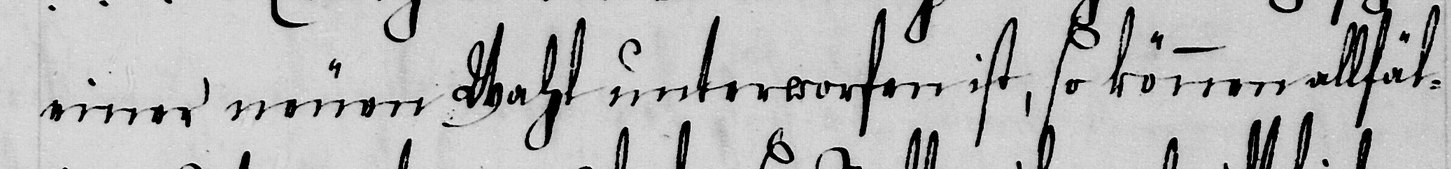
einer neuen Wahl unterworfen ist, so können allfäl¬
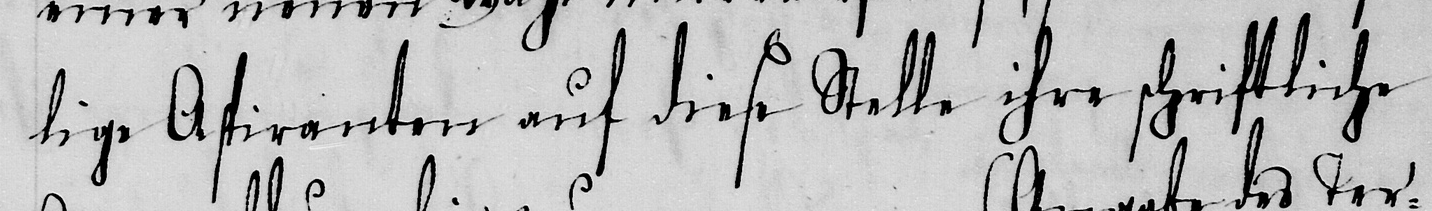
lige Aspiranten auf diese Stelle ihre schriftliche
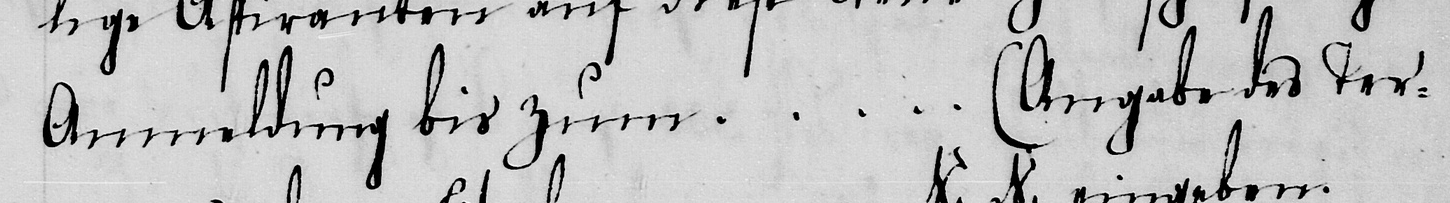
Anmeldung bis zum ... (Angabe der Ter¬
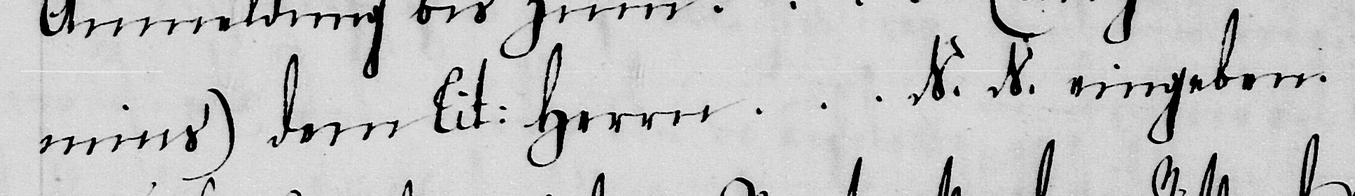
mins) dem Tit: Herrn ... N. N. eingeben.
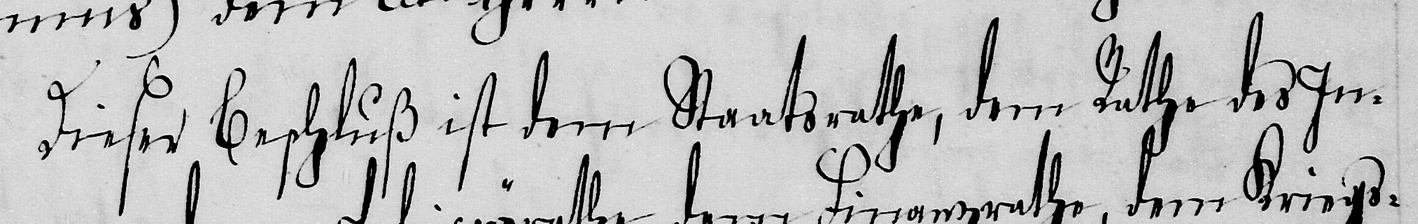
Dieser Beschluß ist dem Staatsrathe, dem Rathe des In¬
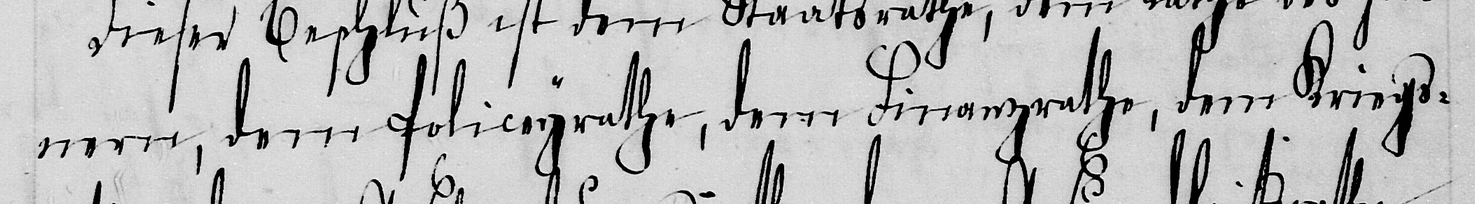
nern, dem Policeyrathe, dem Finanzrathe, dem Kriegs¬
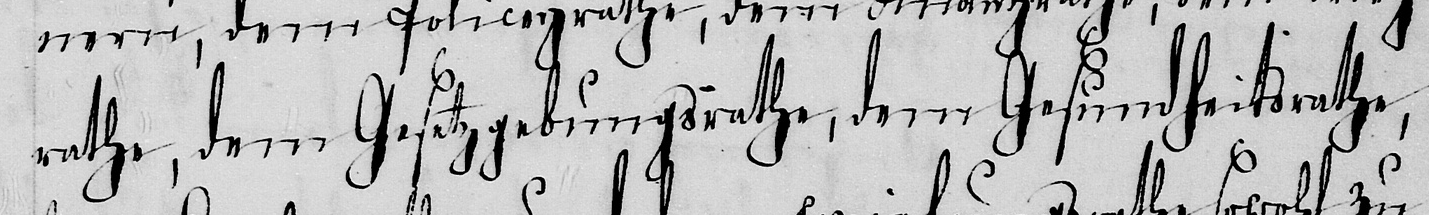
rathe, dem Gesetzgebungsrathe, dem Gesundheitsrathe,
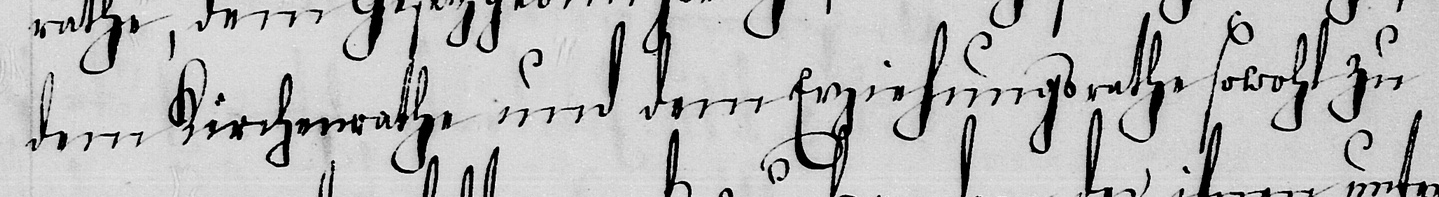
dem Kriegsrathe und dem Erziehungsrathe sowohl zu
